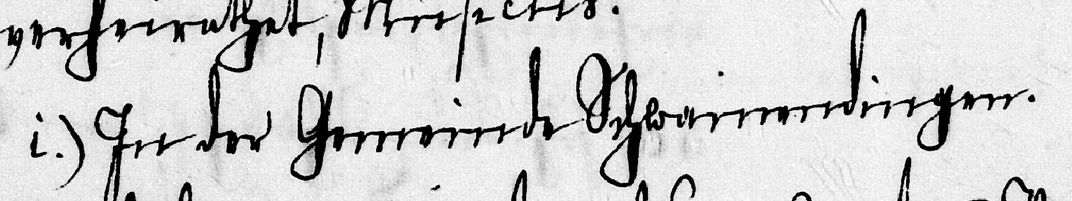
i.) In der Gemeinde Schwamendingen.
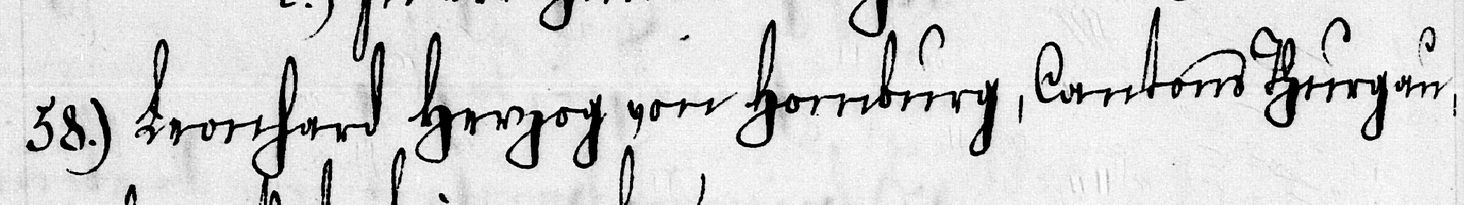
58.) Leonhard Herzog von Homburg, Cantons Thurgau,
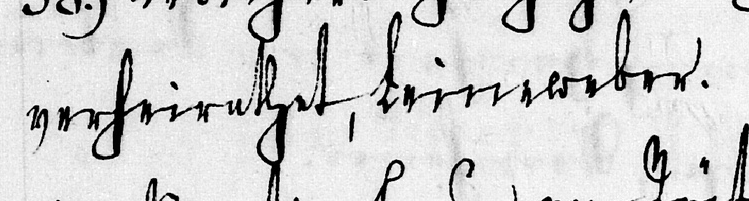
verheirathet, Leineweber.
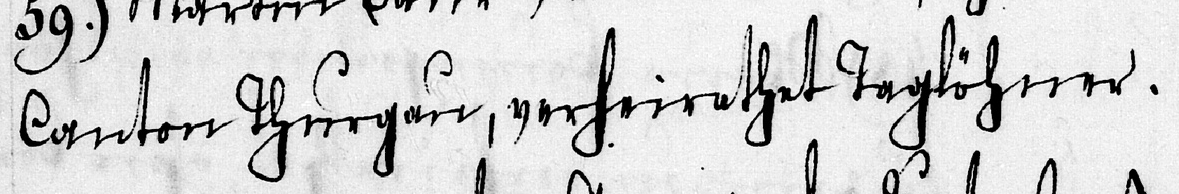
Canton Thurgau, verheirathet Taglöhner.
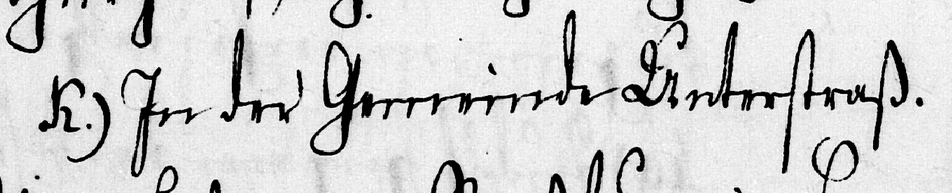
k.) In der Gemeinde Unterstraß.
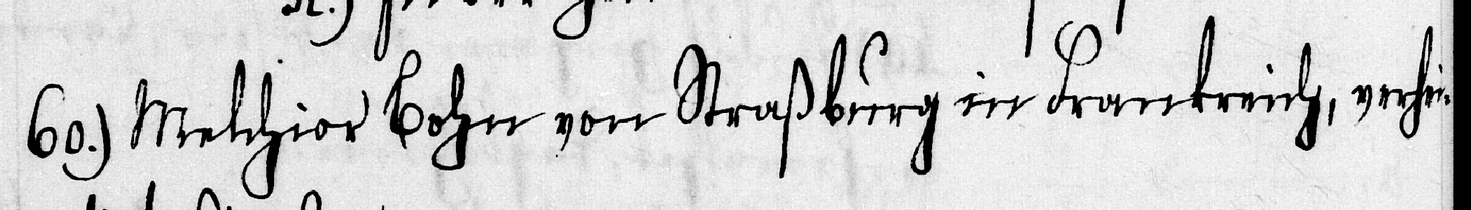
60.) Melchior Bohn von Straßburg in Frankreich, verhe¬
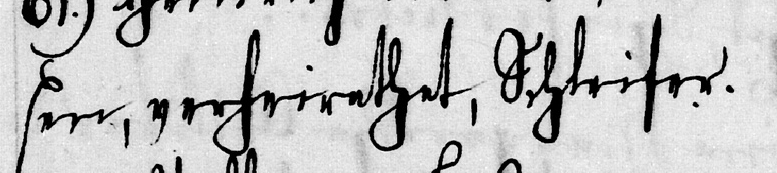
sen, verheirathet, Schleifer.
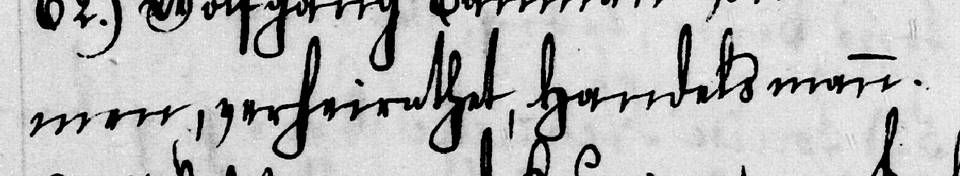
men, verheirathet, Handelsmann.
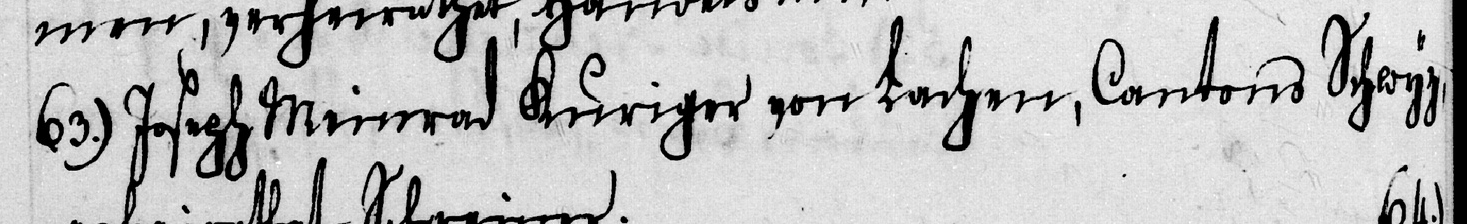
63.) Joseph Meinrad Kuriger von Lachen, Cantons Schwyz,
